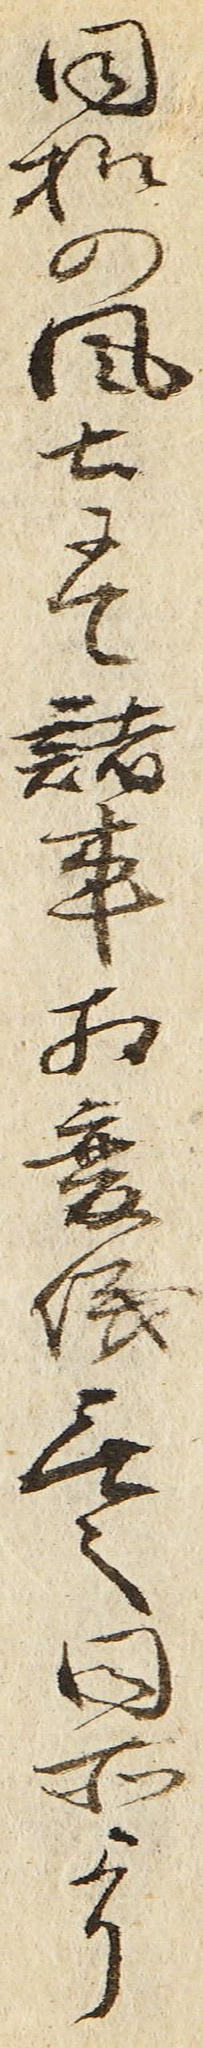同様の風土にて諸事相変儀無之同所より
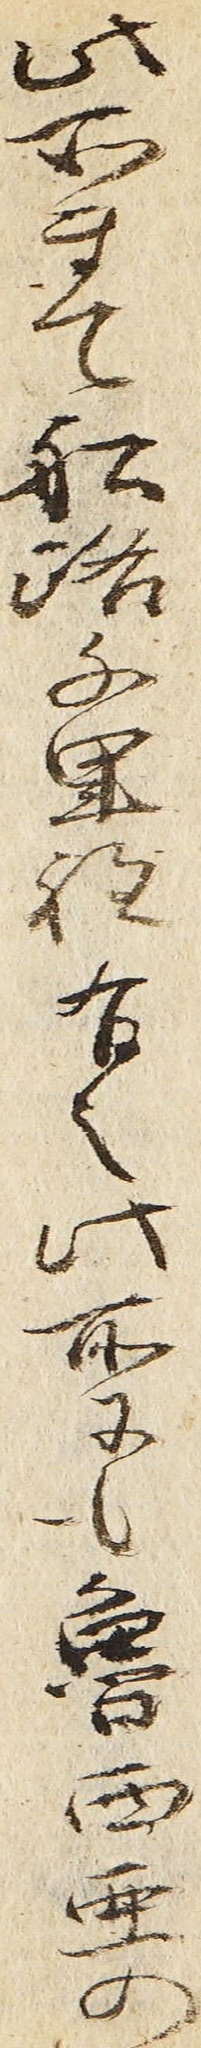此所まて船路千里程有之此所にも魯西亜の
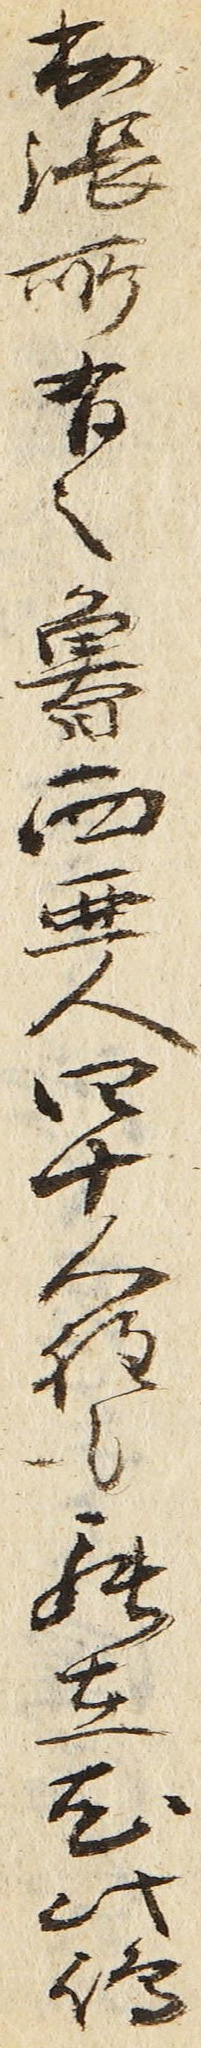出張所有之魯西亜人四十人程も罷在尤此島
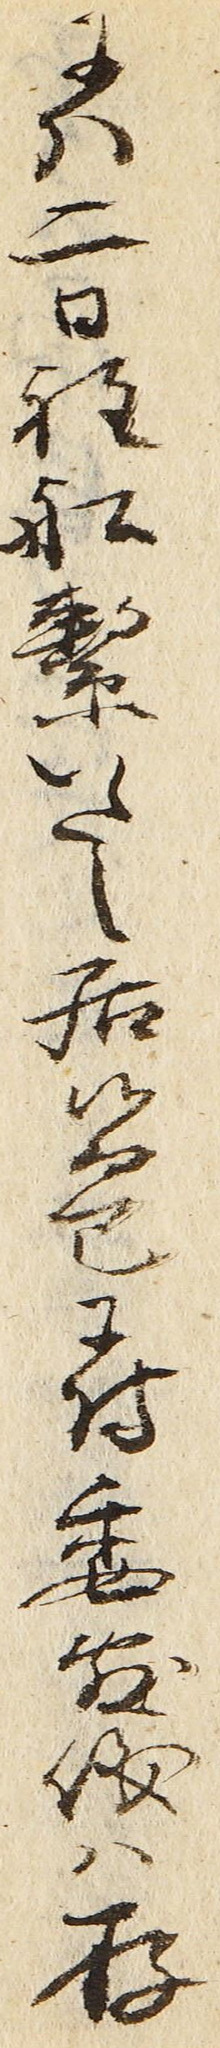には二日程船繋いたし居候而已に付委敷儀は存
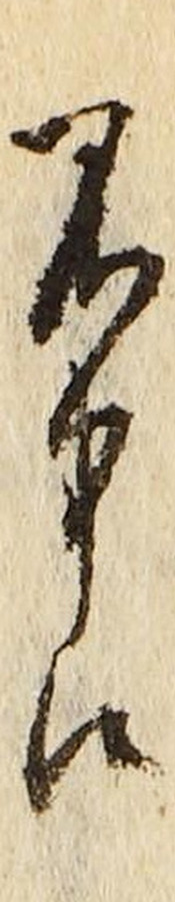不申候
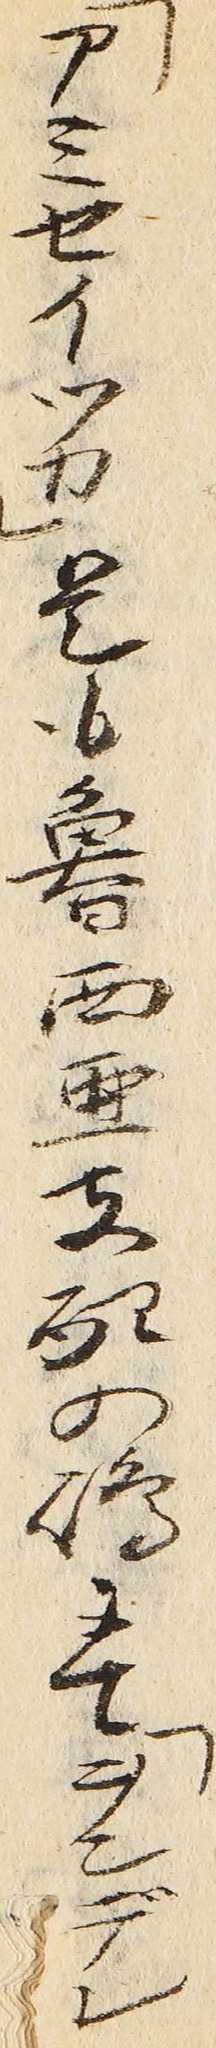「アミセイツカ」是も魯西亜支配の島にて「ヲンデレ
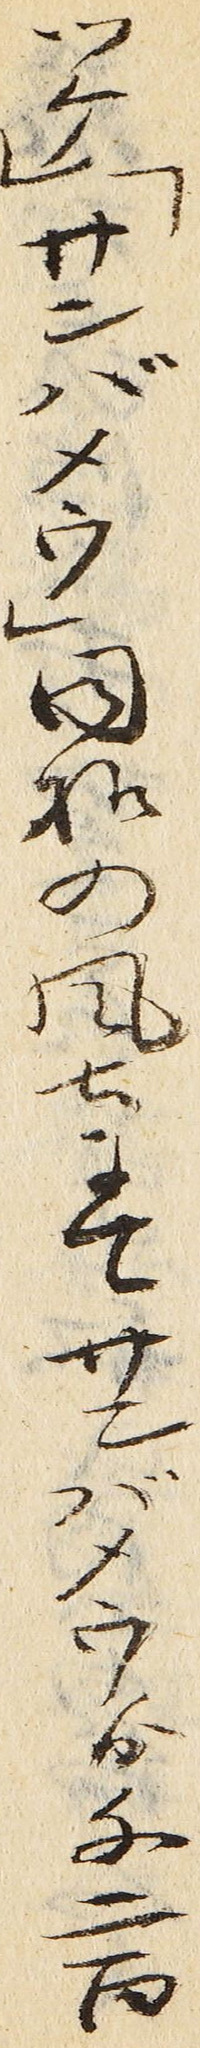ツケ」「サンバメウ」同様の風土にてサンバメウゟ千二百
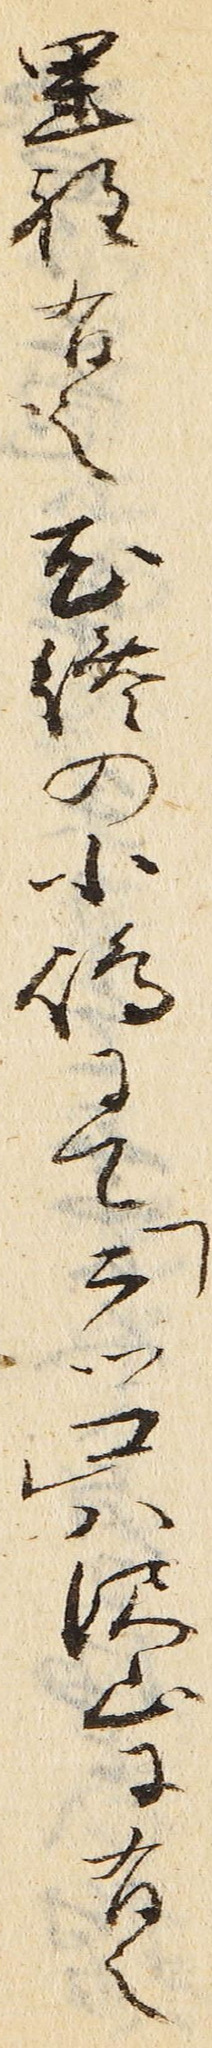里程有之尤纔の小島にて「ラツコ」は沢山に有之
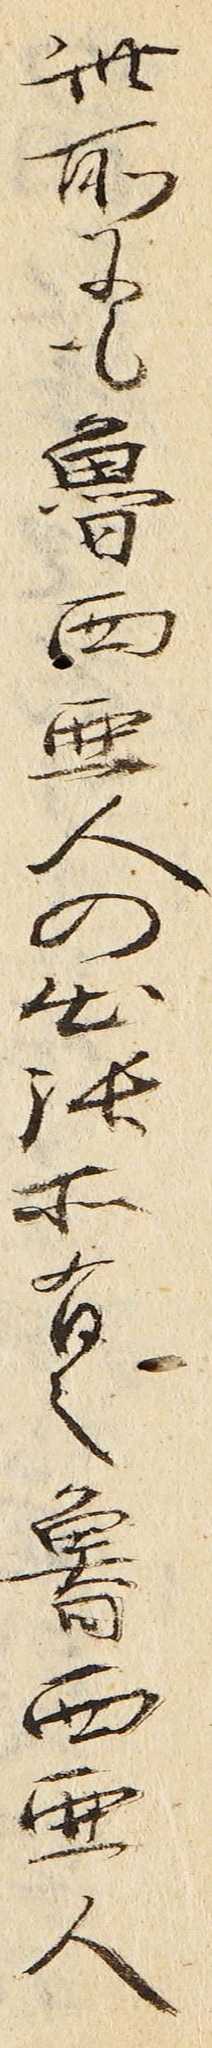此所にも魯西亜人の出張所有之魯西亜人
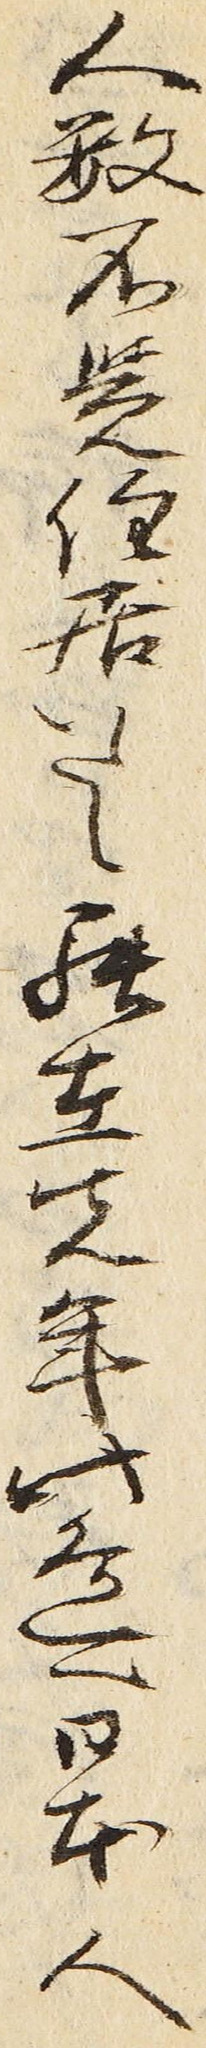人数不覚住居いたし罷在先年此辺へ日本人
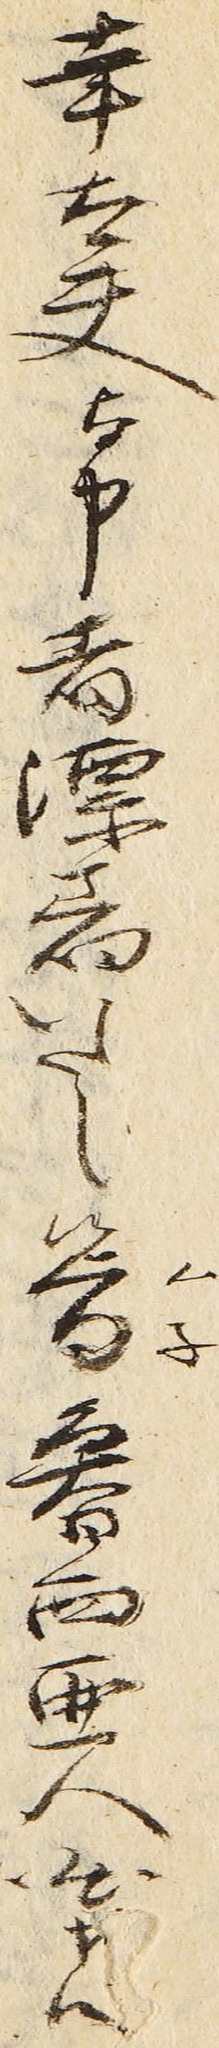幸太夫と申者漂着いたし候旨魯西亜人咄申候
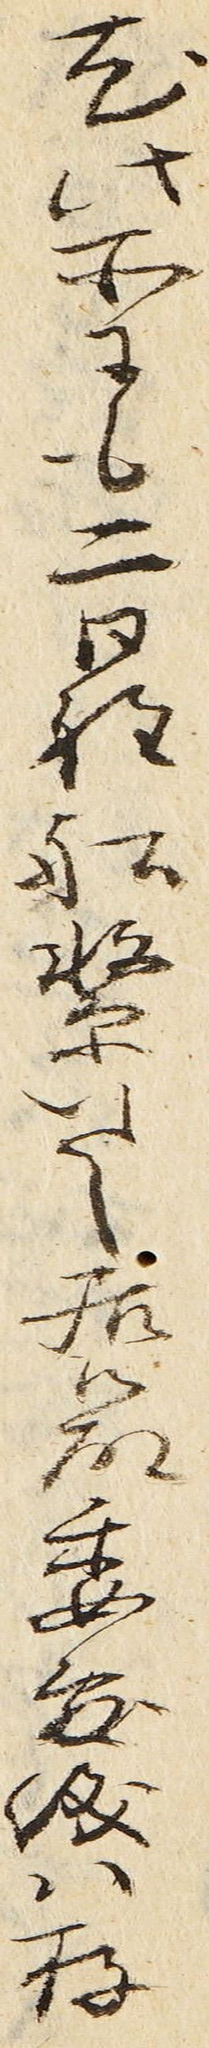尤此所にも二日程船繋いたし居候故委敷儀は存
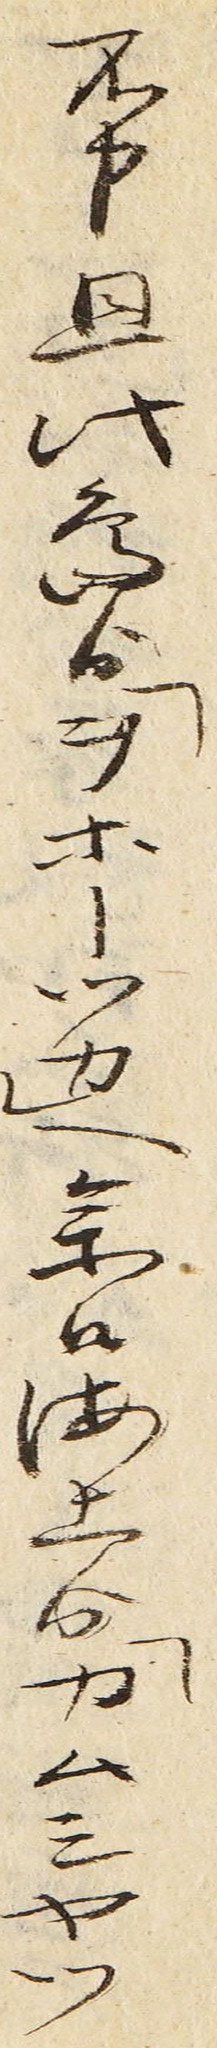不申且此島ゟ「ヲホーツカ」へ参候海上ゟ「カムシヤツ
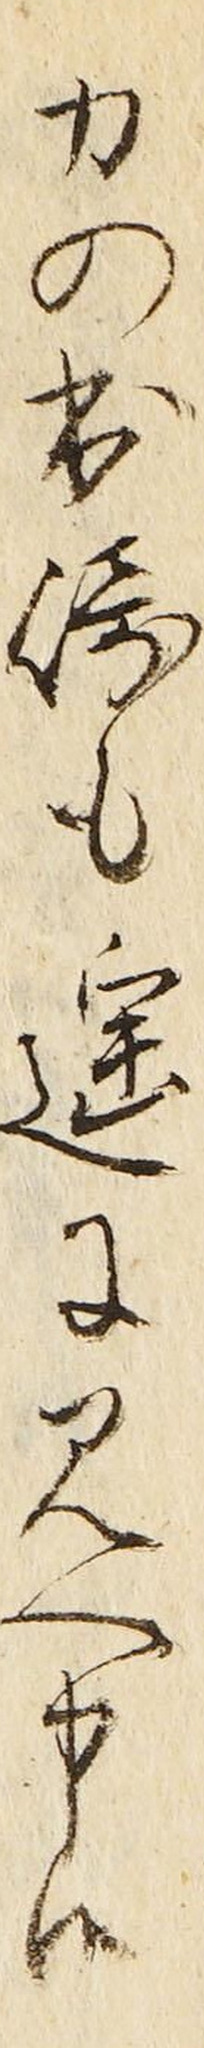カ」の出崎も遥に見へ申候
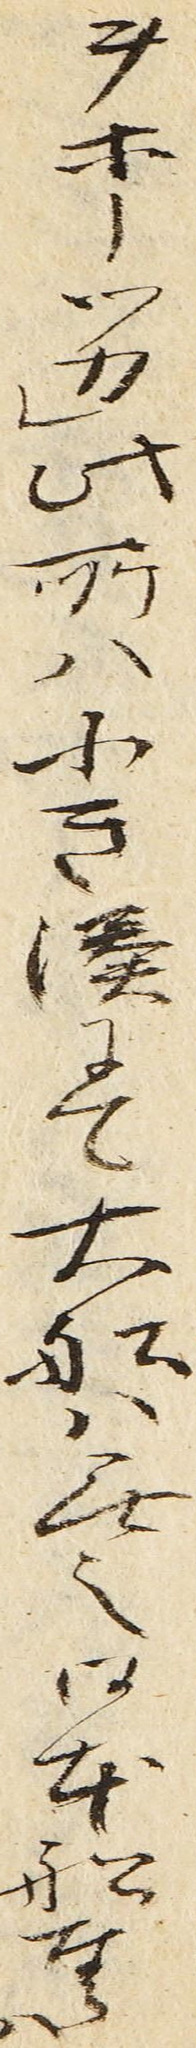「ヲホーツカ」此所は小き湊にて大船は無之日本船ならは
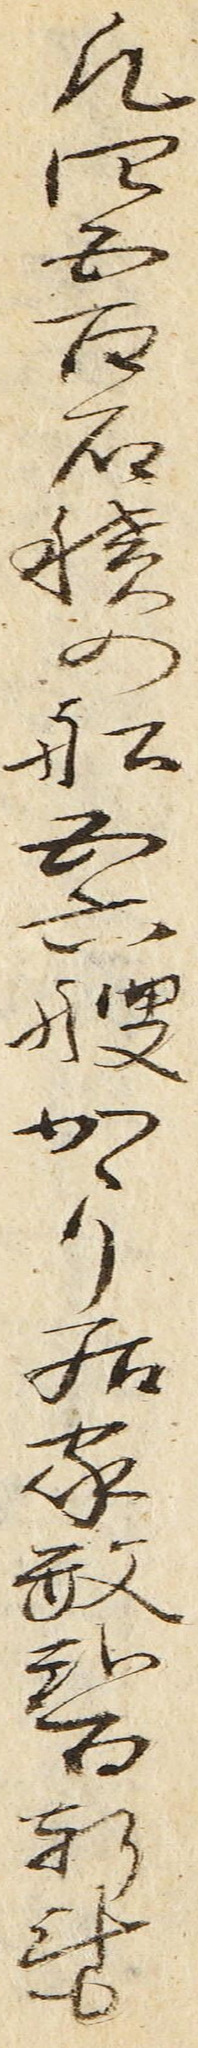凡四五百石積の船五六艘かゝり居家数弐百軒斗も
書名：漂民後記
